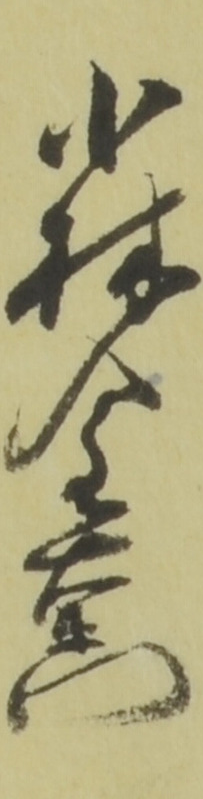小林金右衛門
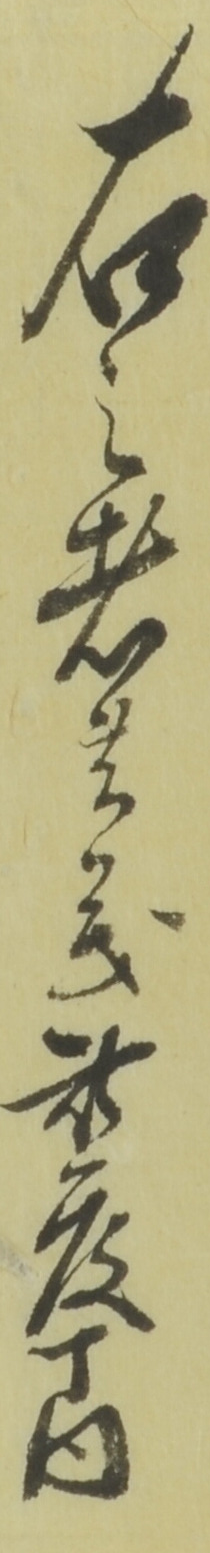右之者共義此度丁内
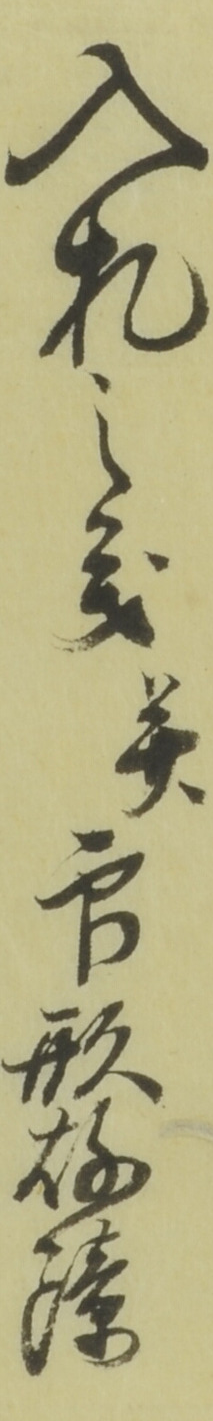入札之義并印形故障
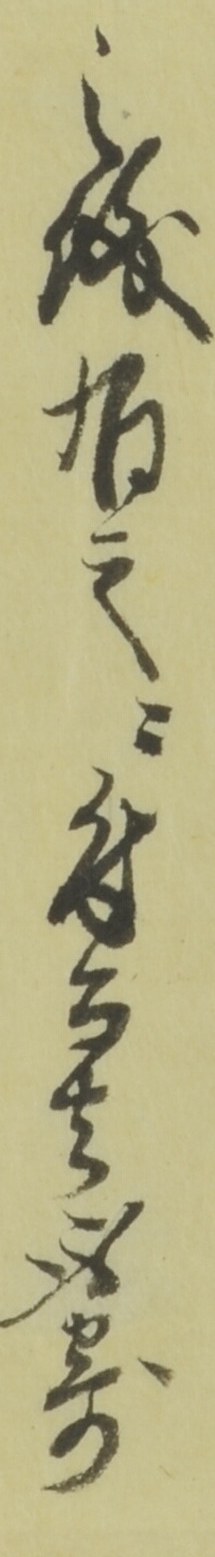之儀有之ニ付而は身寄
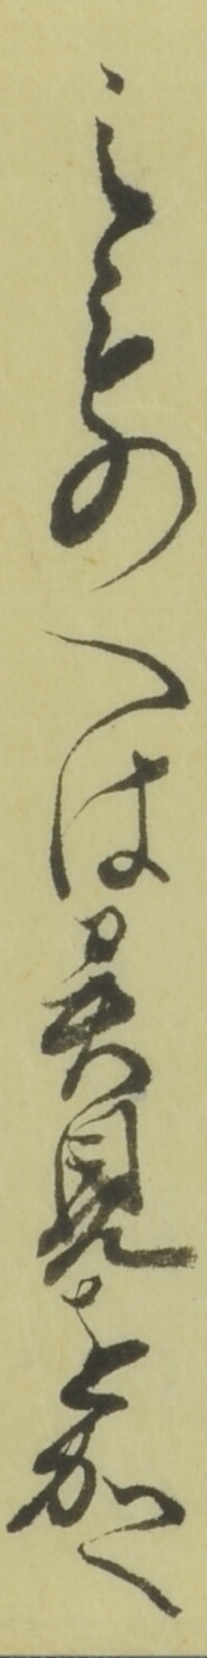之ものへは異見を加へ
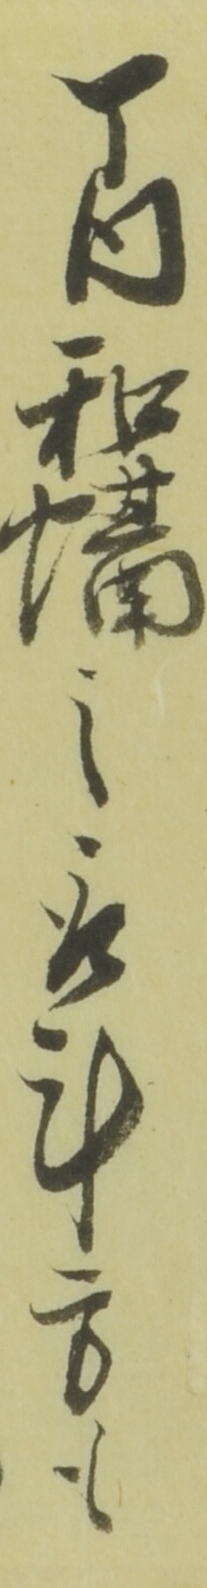丁内和融之取計方も
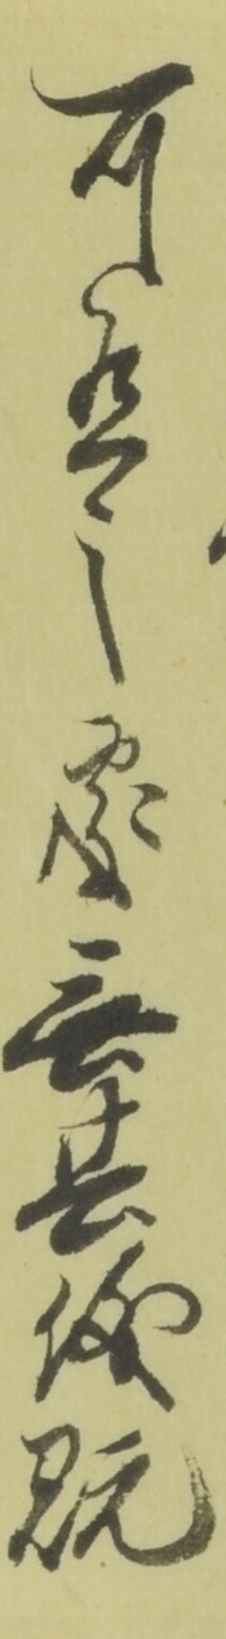可有之処無其儀翫
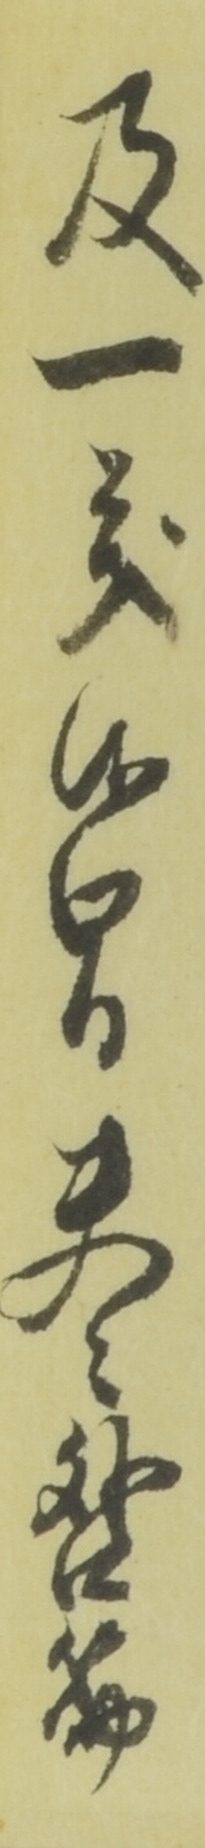及一義候間夫々咎筋
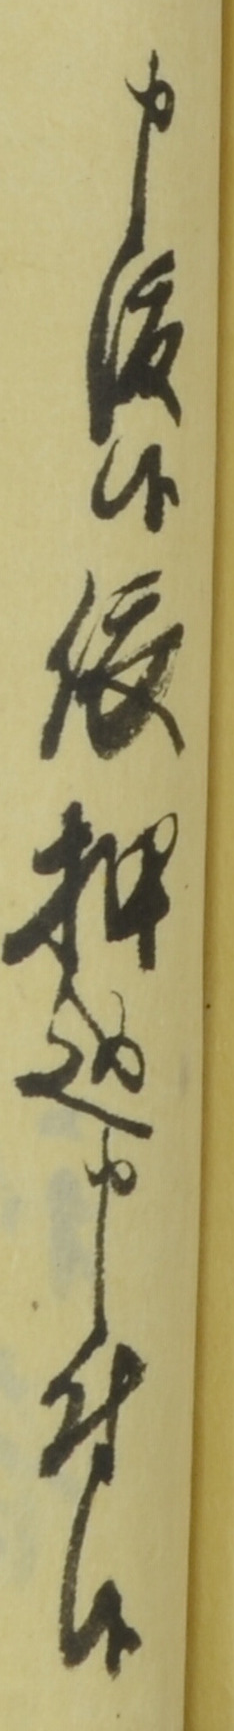申渡候依押込申付候
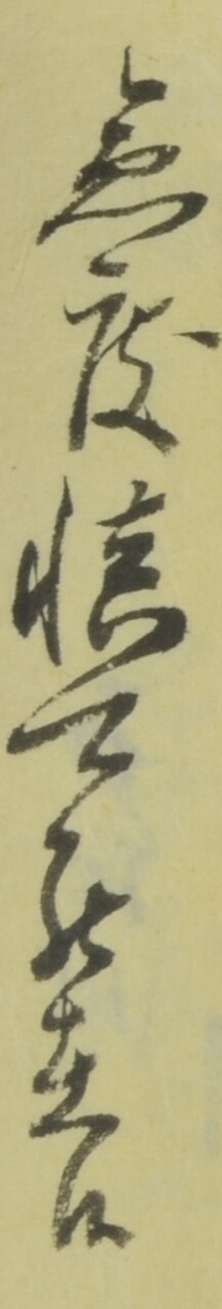急度慎可罷在候
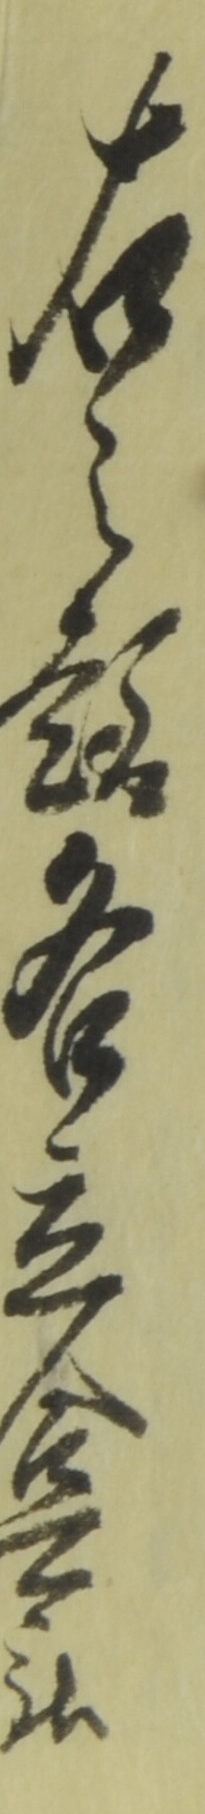右之趣各立合可被

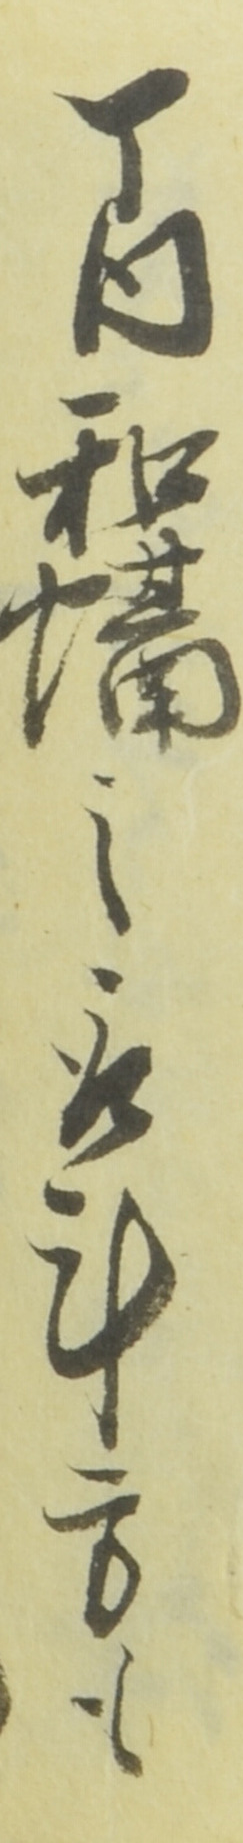丁内和融之取計方も
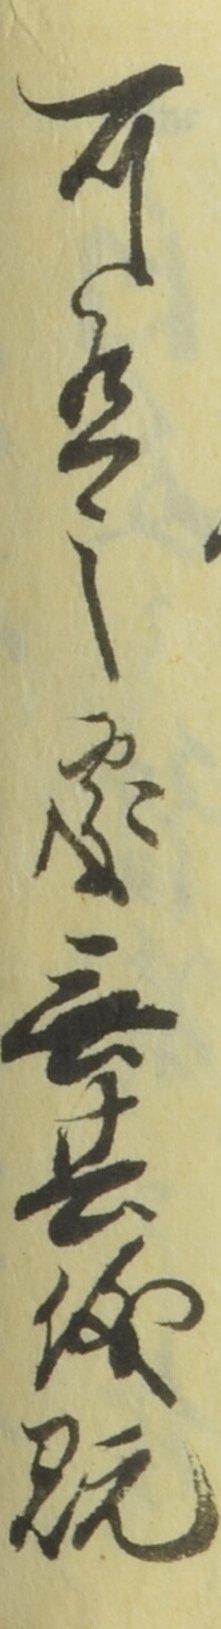可有之処無其儀翫
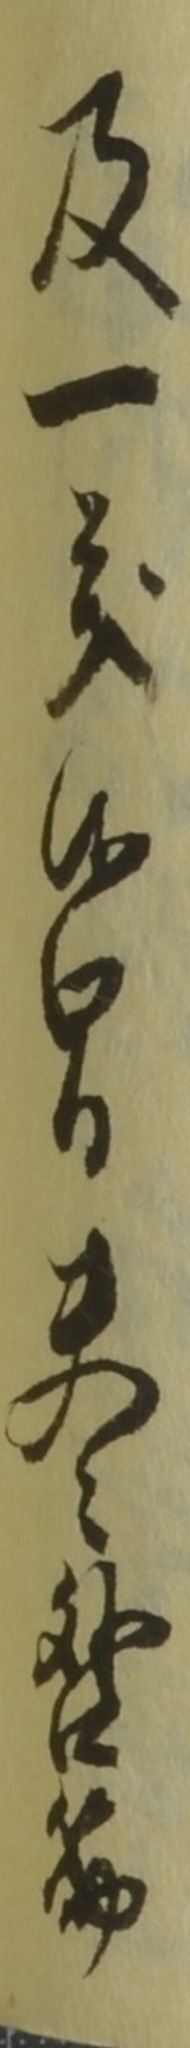及一義候間夫々咎筋
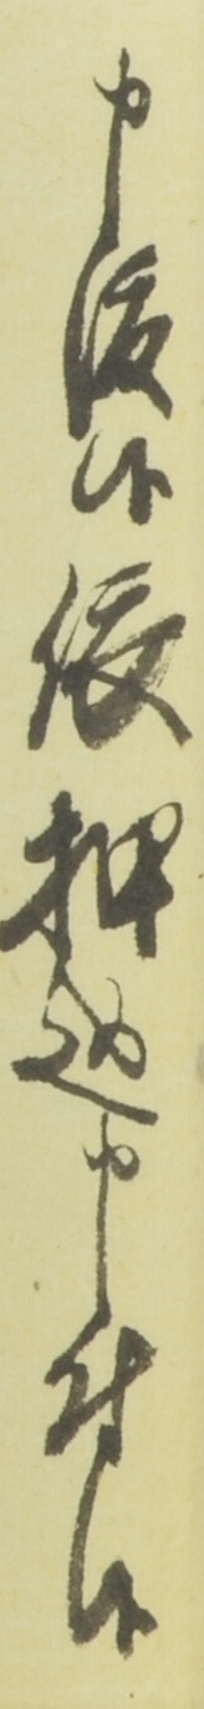申渡候依押込申付候
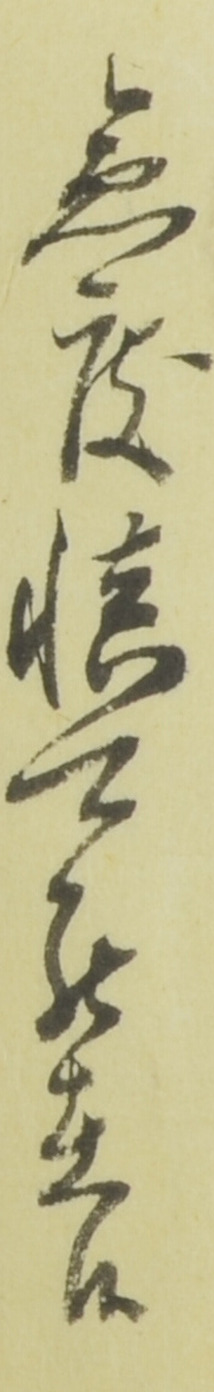急度慎可罷在候
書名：御触書御書附控
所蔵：伊那市立高遠町図書館・合同会社AMANE
